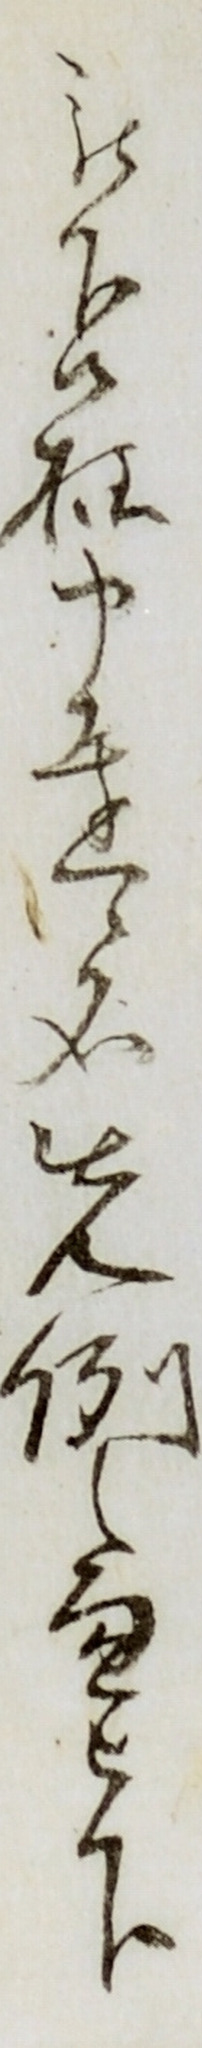被下候様申達候処先例之通被下
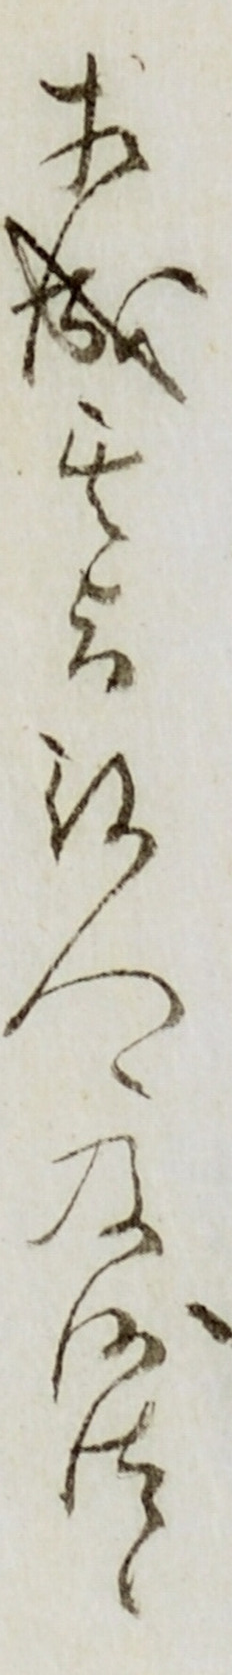相成其旨役人へ及沙汰候
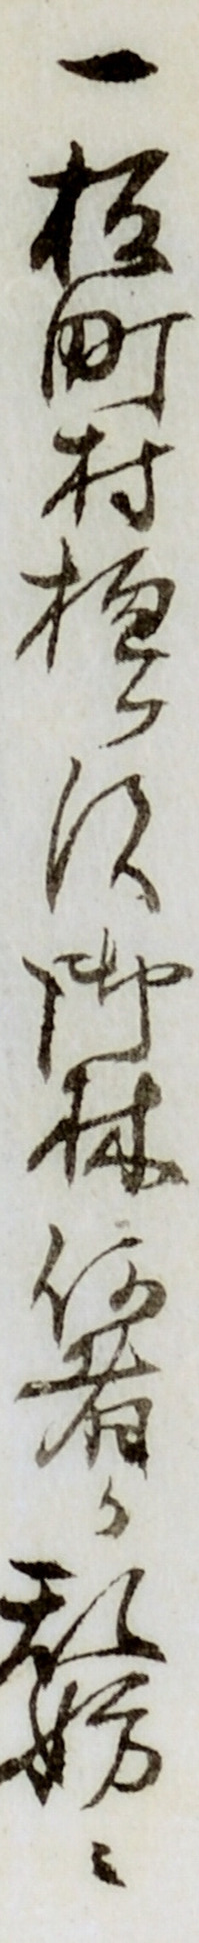一板町村樋ヶ沢御林何者か乱妨に
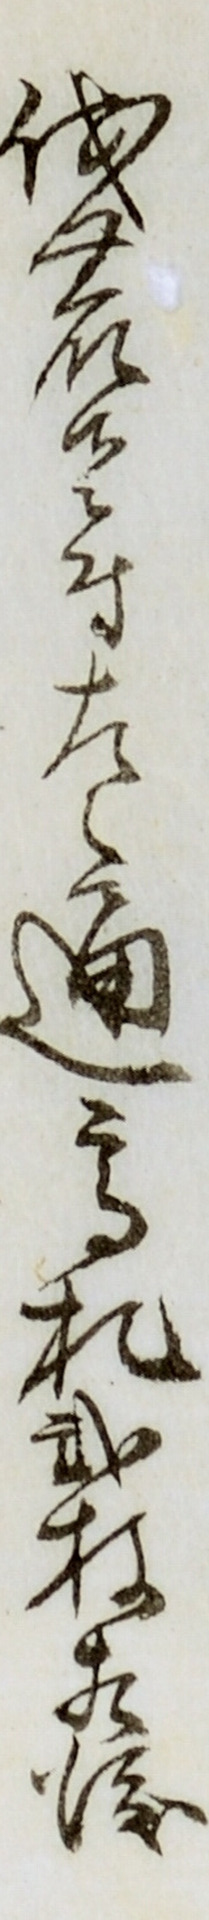伐荒候に付左之通高札弐枚相渡
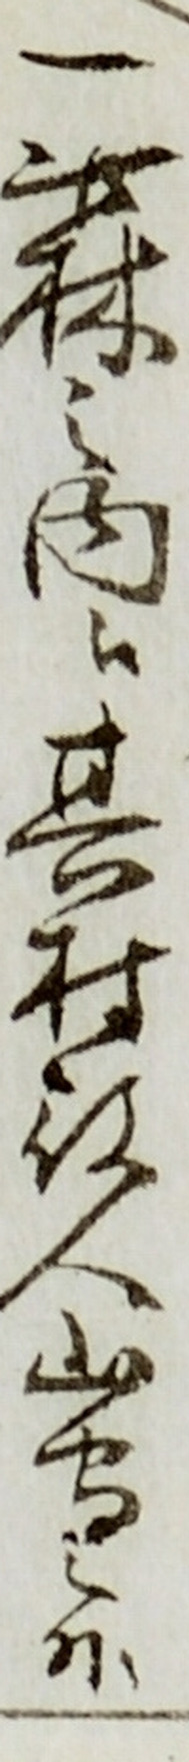一此林之内え其村役人山守之外
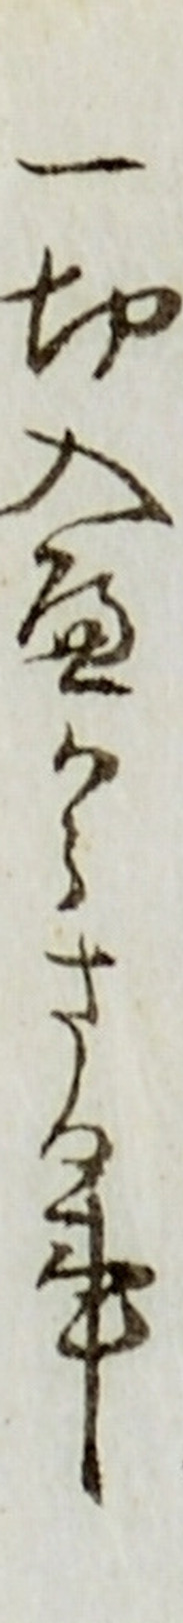一切入へからさる事
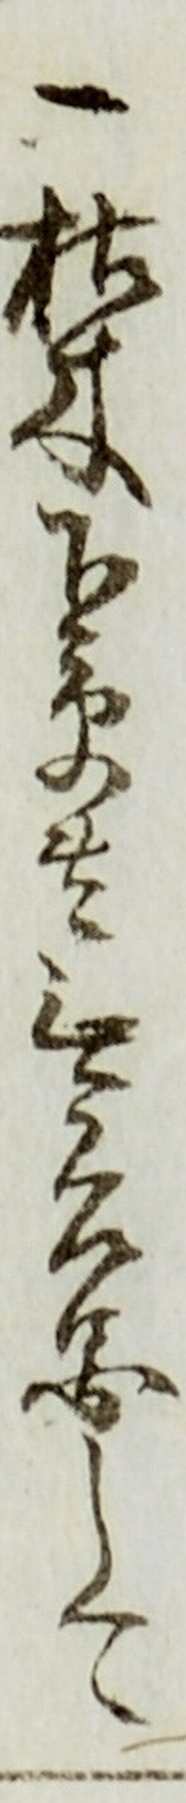一枯木下草共無差図して
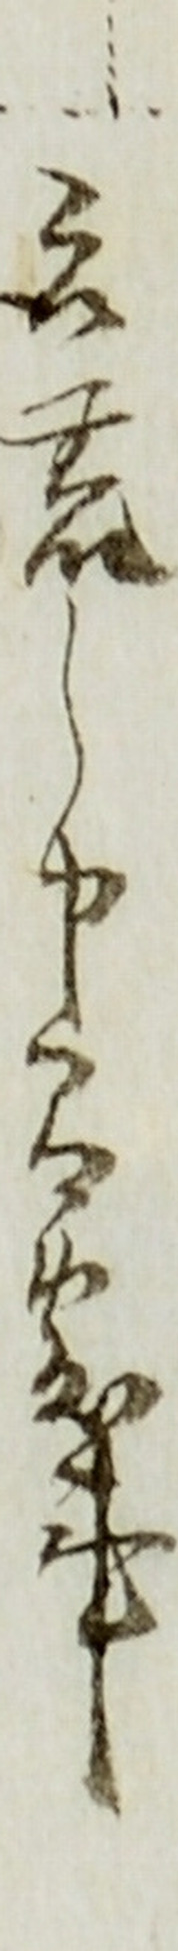取荒し申間敷事
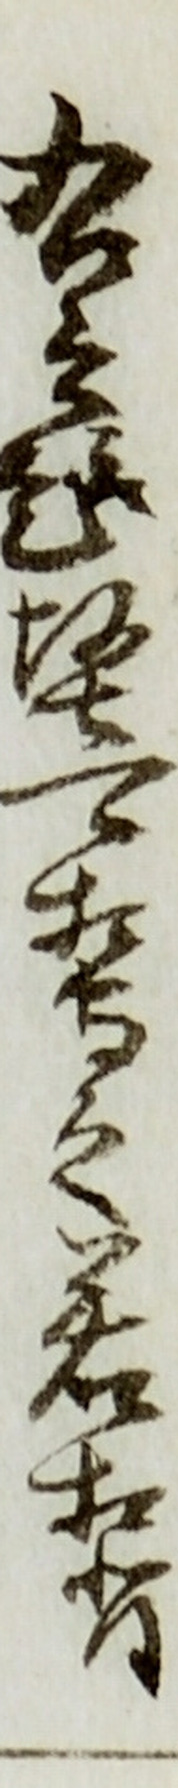右之趣堅可相守之若相背
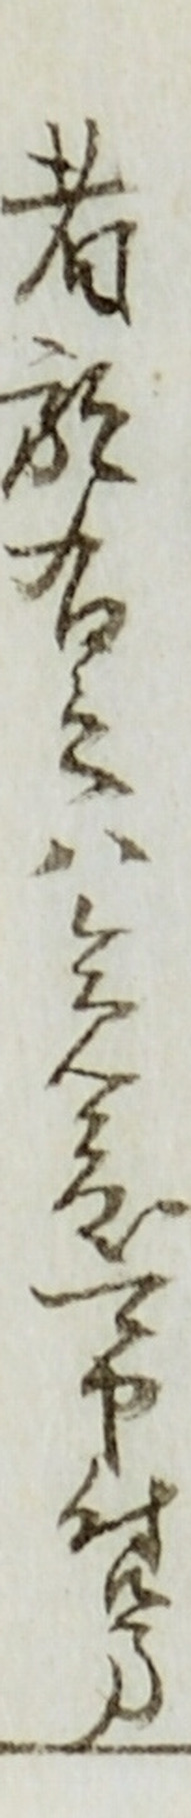者於有之は急度可申付候事
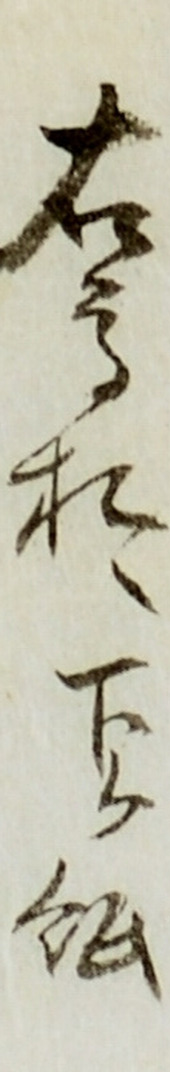右高札へ下ヶ紙
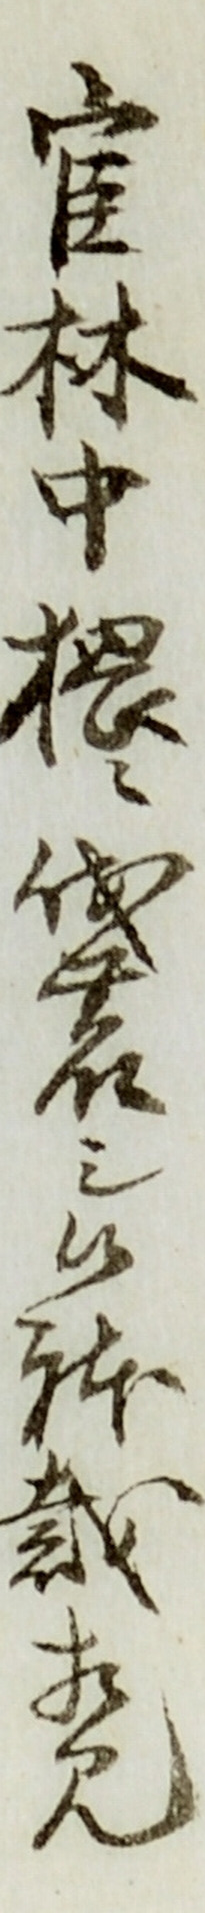官林中猥に伐荒シ候体裁相見
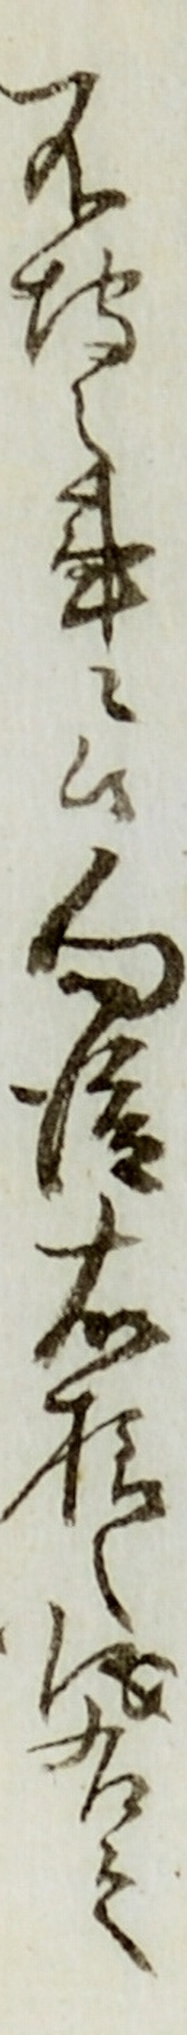不埒之事に候向後右様之儀有之
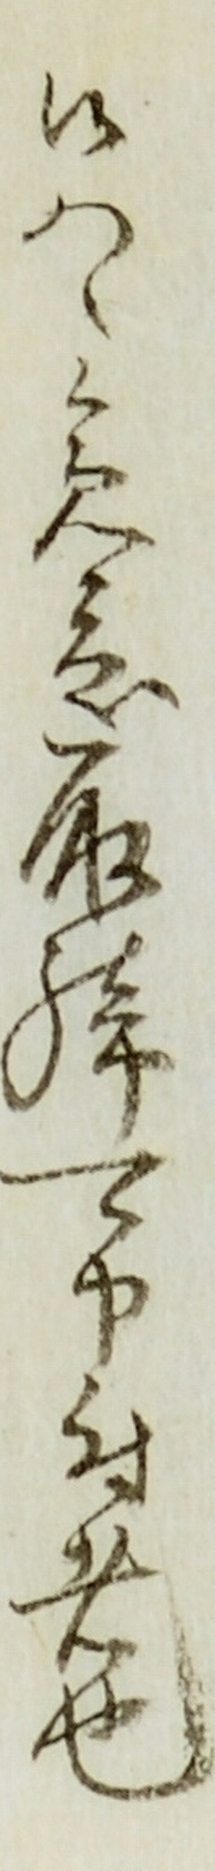候はゝ急度取締可申付者也
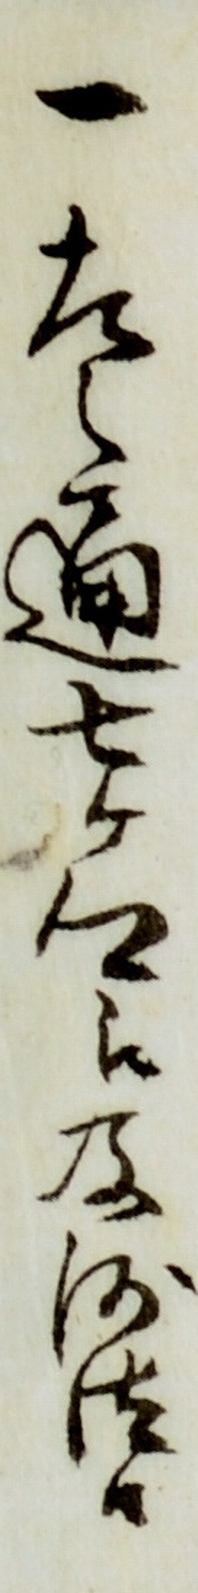一左之通七ヶ郷え及沙汰候

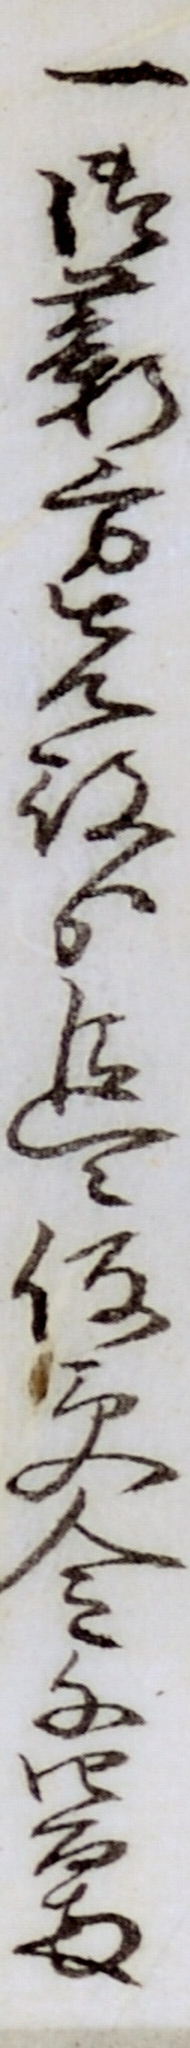一御薪方先役ゟ追々仮受金千四百両
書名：山林方諸事御用留
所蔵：伊那市立高遠町図書館・合同会社AMANE
